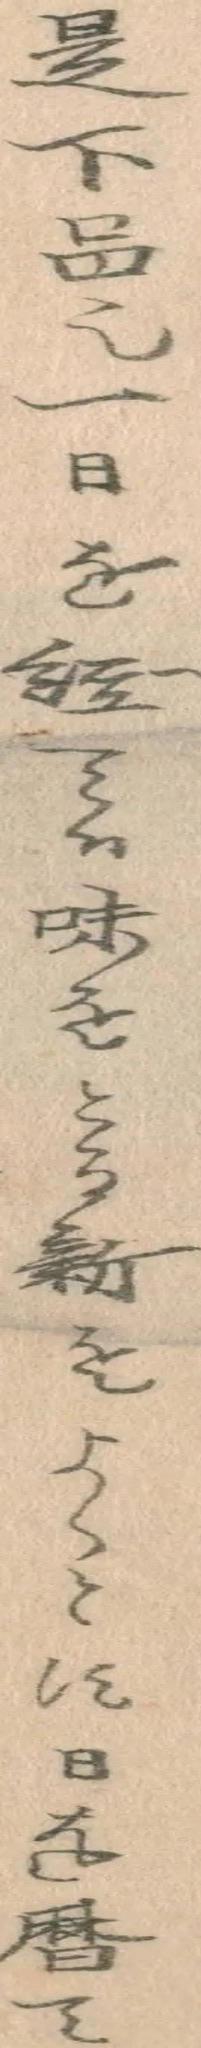是下品也一日を経ては味をとる新をよしとす日を暦て
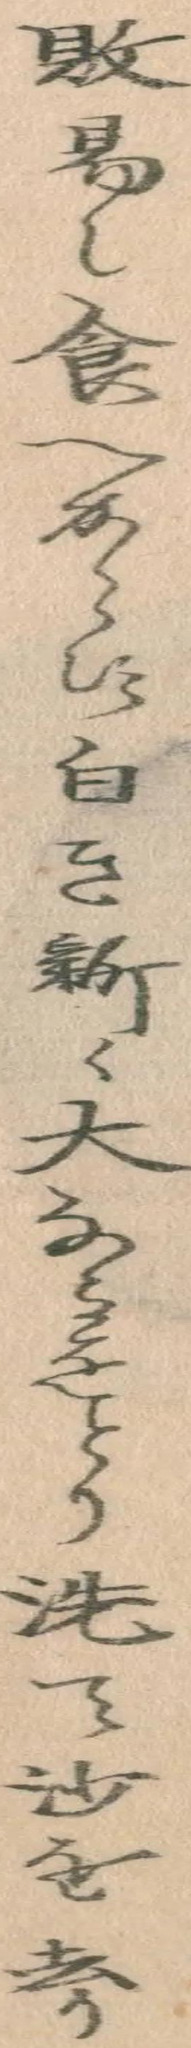敗易し食へからす白き新く大なるをとり洗て沙を去り
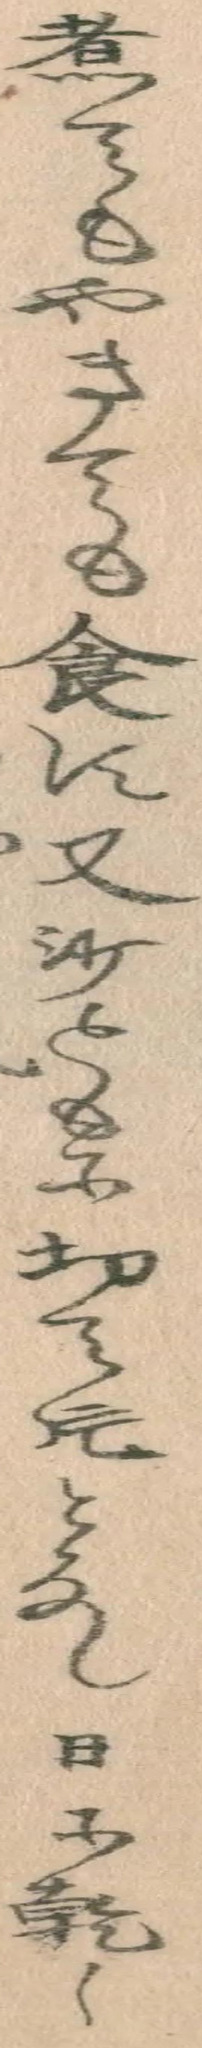煮てもやきても食す又沙ともに切て片となし日に乾し
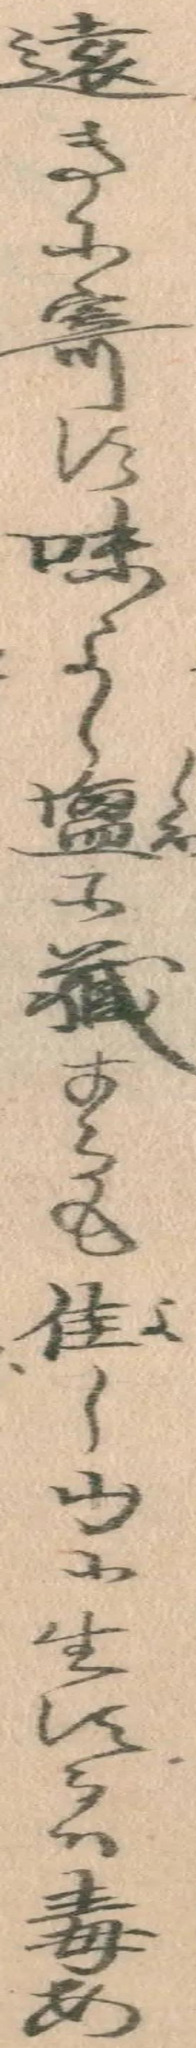遠きに寄す味よし塩に蔵するも佳し山に生するは毒あ
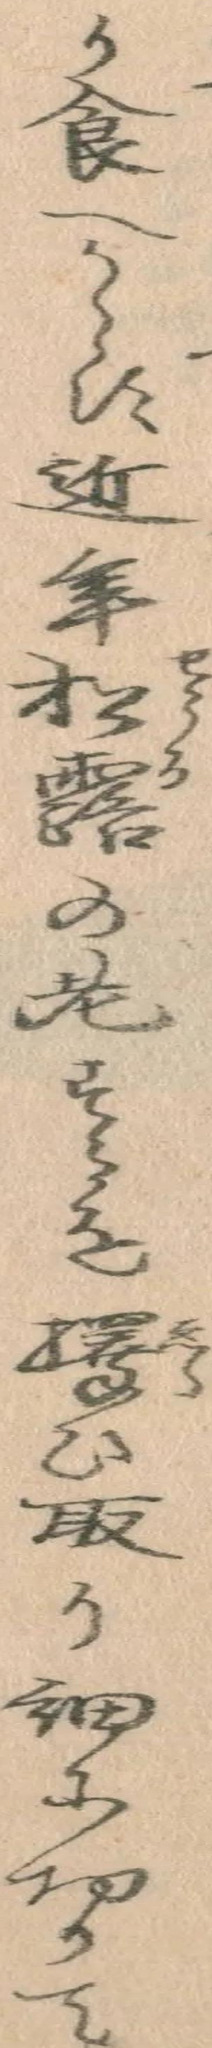り食へからす近年松露の老するを択ひ取り細に切りて
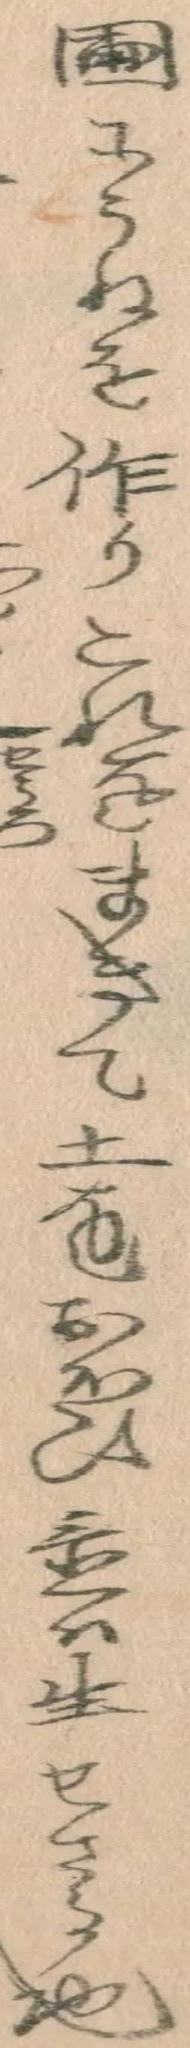圃にうねを作りこれをまきて土をおほひ置は生せさる地
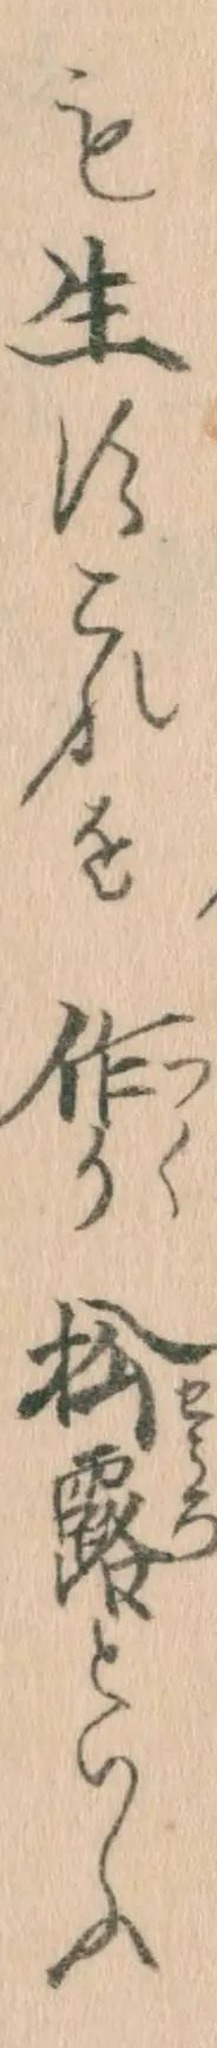も生すこれを作り松露といふ
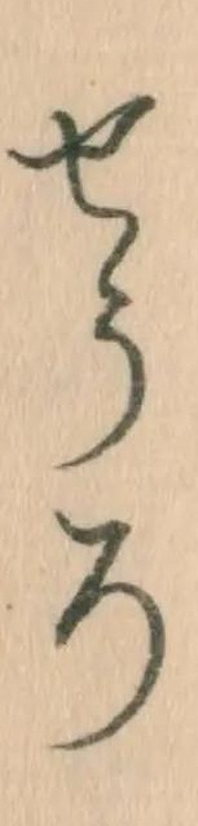せうろ
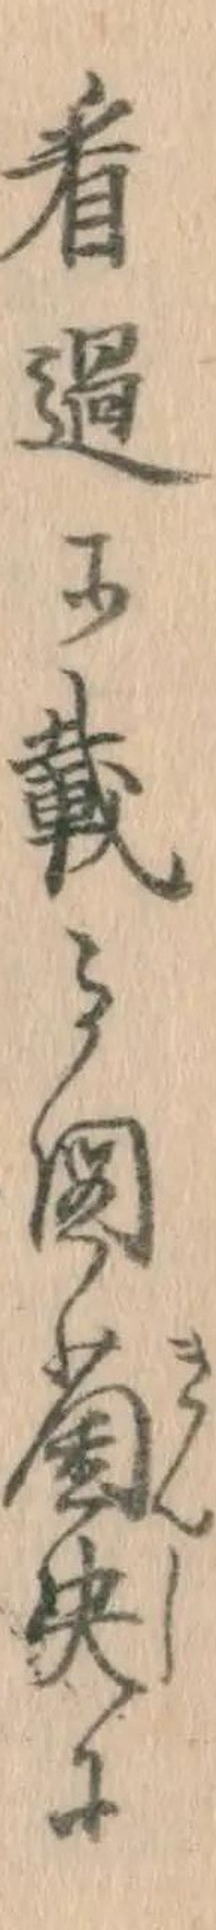看過に載る図菌史に
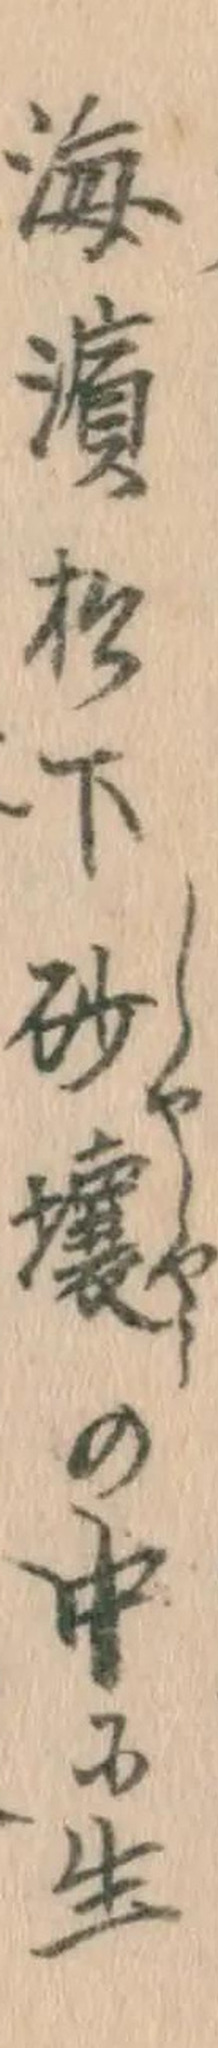海浜松下砂壌の中に生
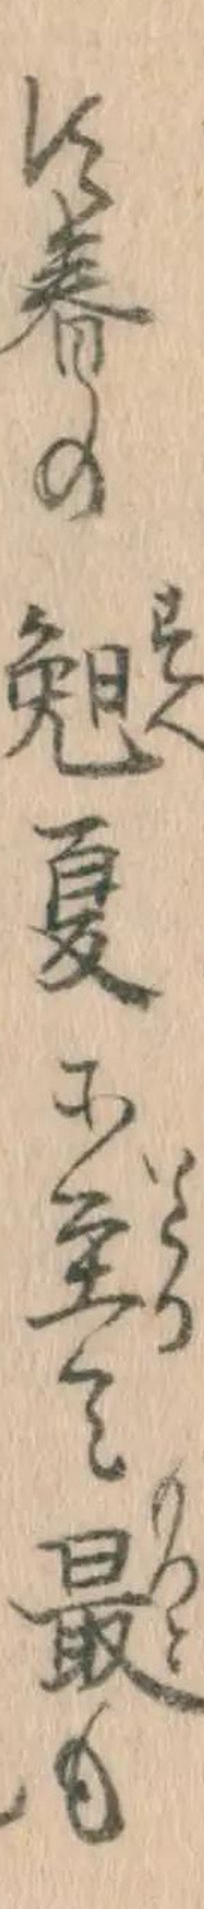す春の晩夏に至て最も
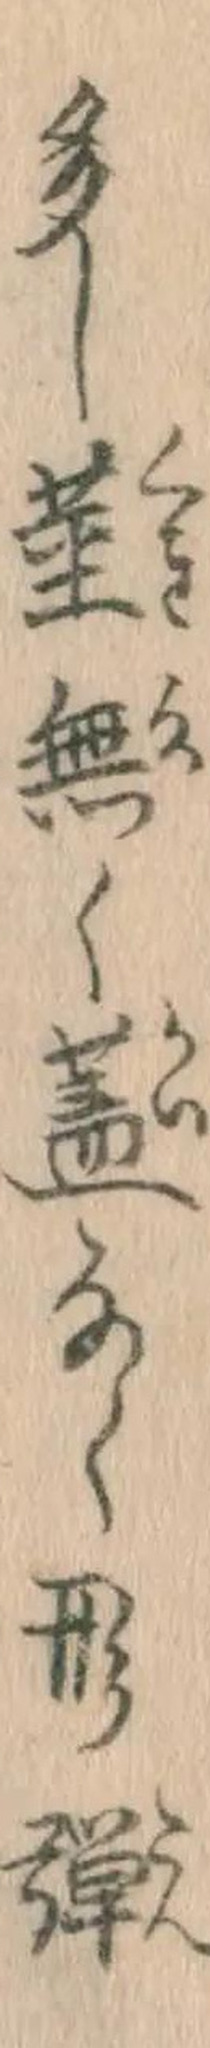多し茎無く蓋なく形弾
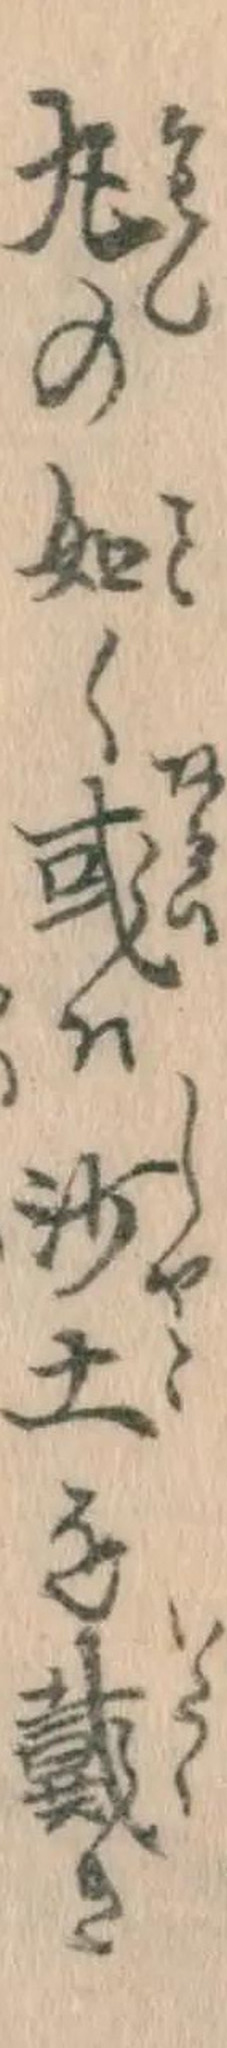丸の如く或は沙土を戴き
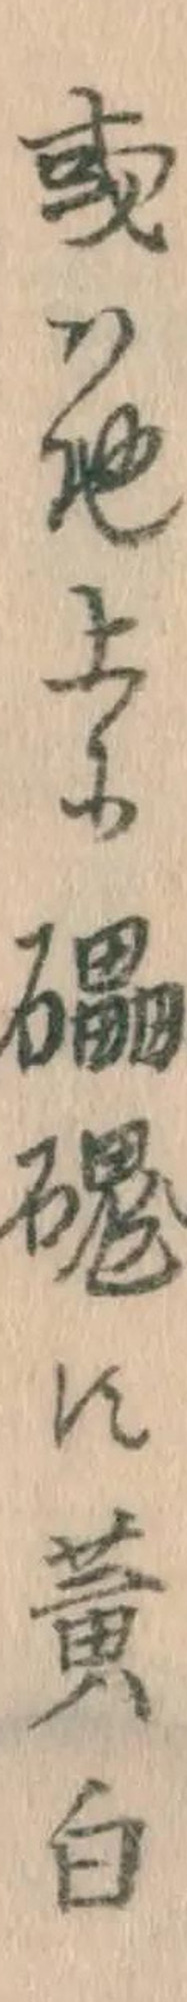或は地上に礧磈す黄白
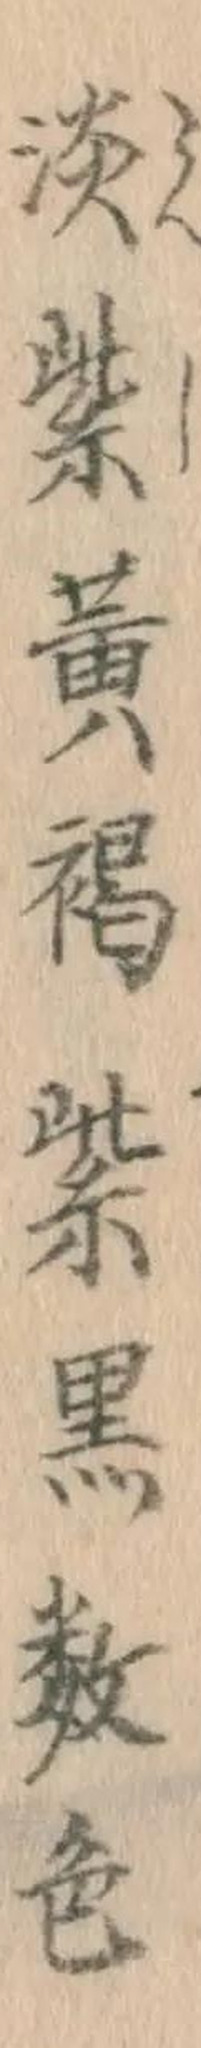淡紫黄褐紫黒数色
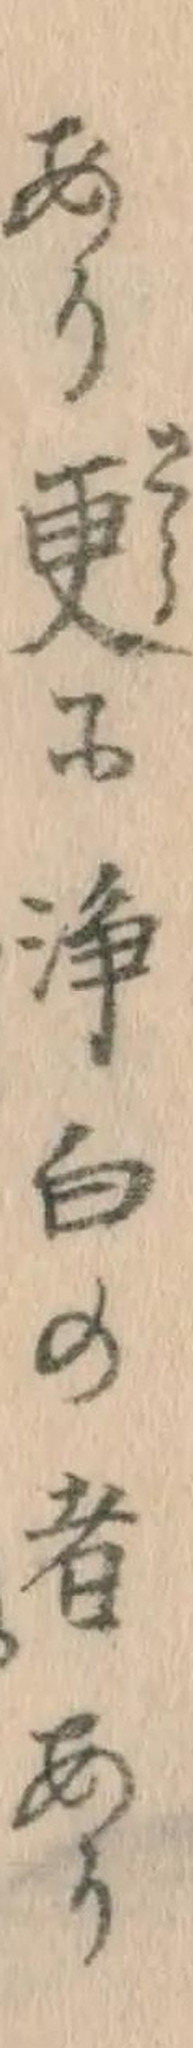あり更に浄白の者あり
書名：本草図譜. 巻55-57
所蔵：国立国会図書館 National Diet Library, JAPAN
